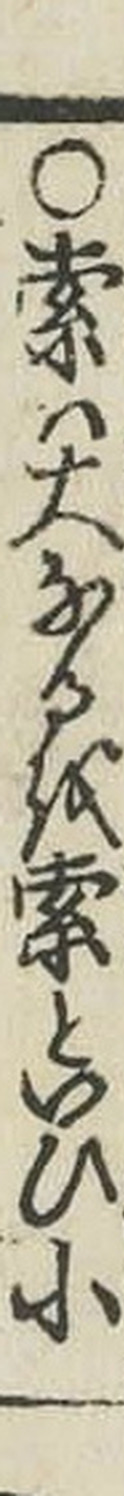○索は大なるを索といひ小
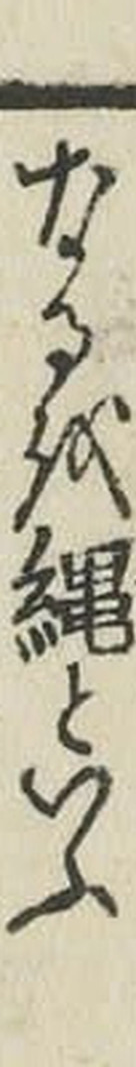なるを縄といふ
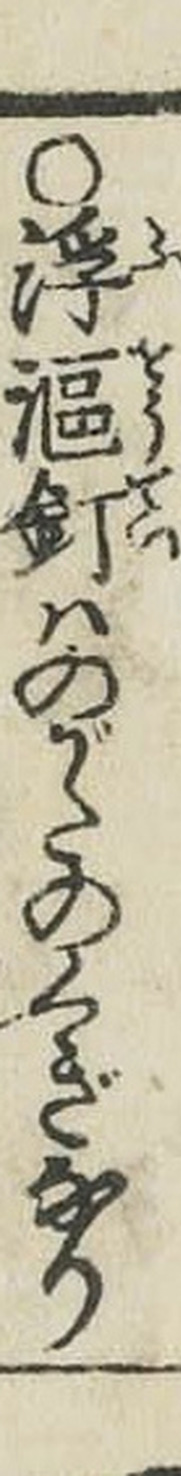○浮漚釘はのがたのくぎなり
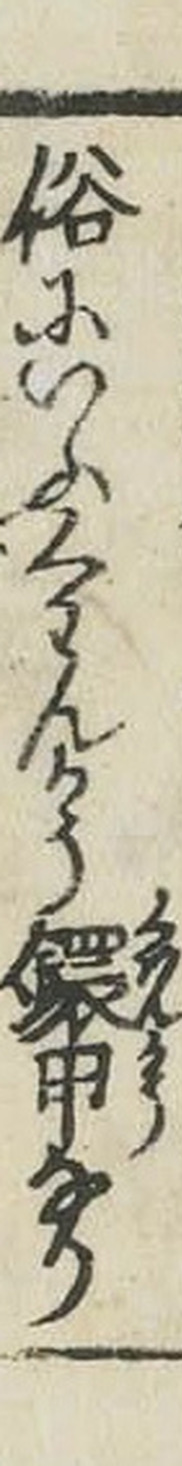俗にいふくわんかう鐶甲なり
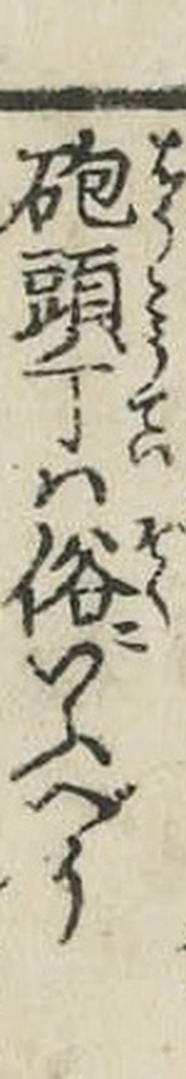砲頭丁は俗
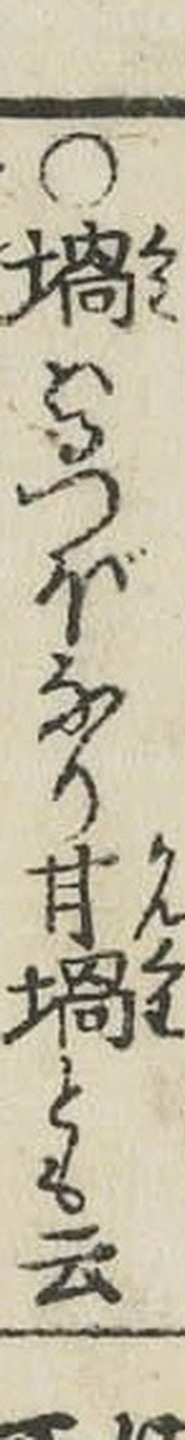○堝はるつぼなり甘堝とも云
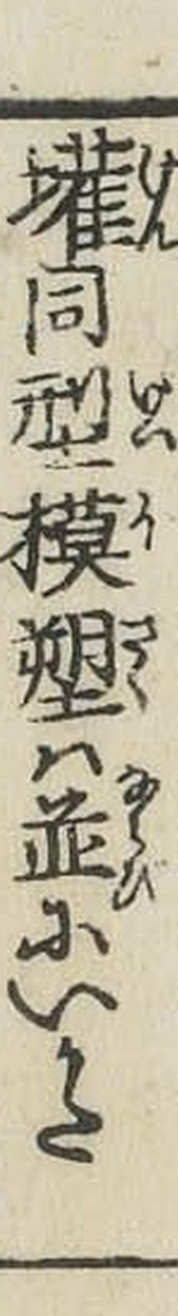壦同型摸塑は並にいかた
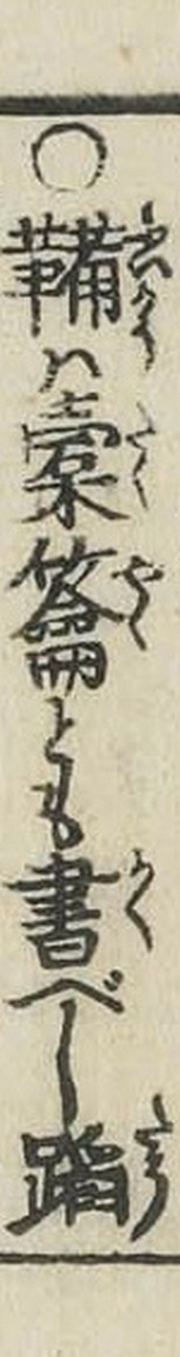○鞴は槖籥とも書べし蹈
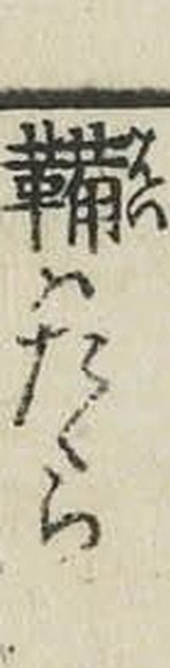鞴はたゝら
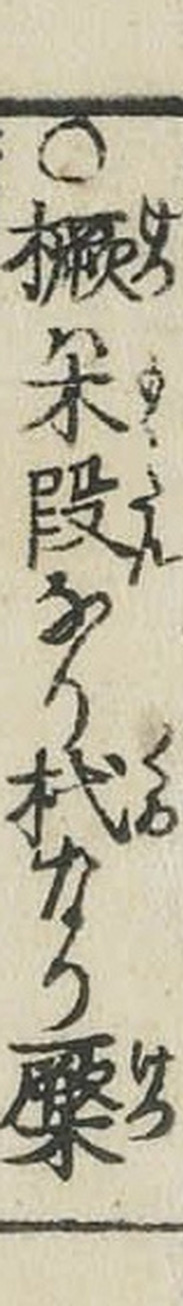○橛は木段なり杙なり橜
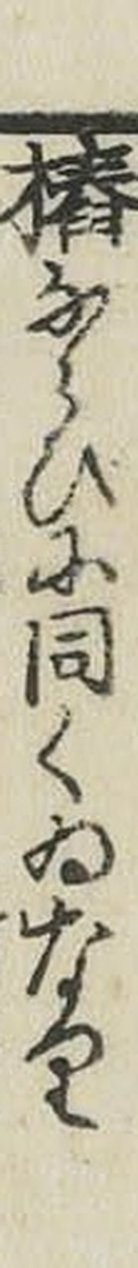樁ならびに同くゐなり
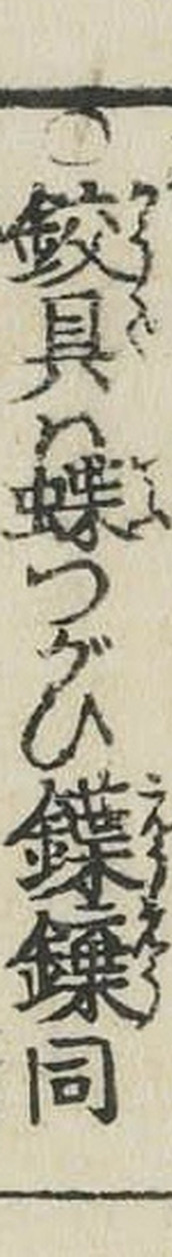○鉸具は蝶つがひ鍱▢同
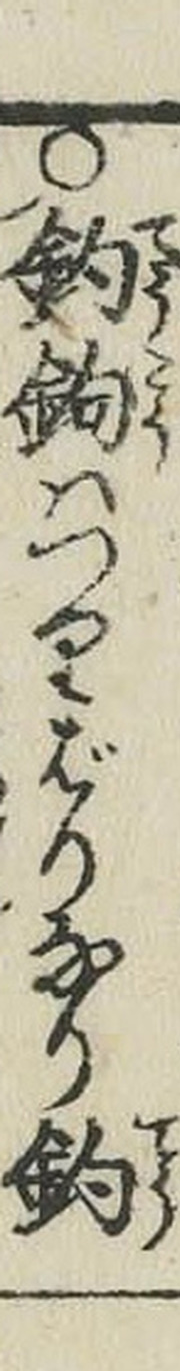○釣鉤はつりばりなり釣
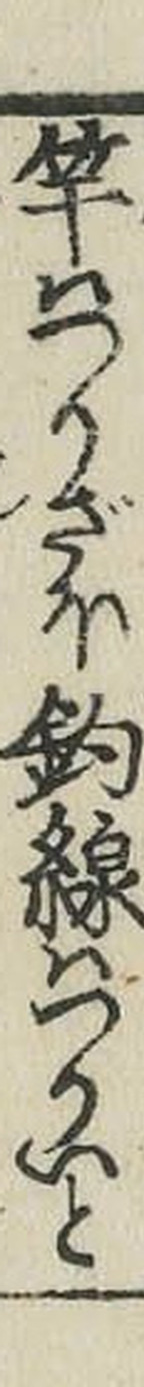竿はつりざほ釣線はつりいと
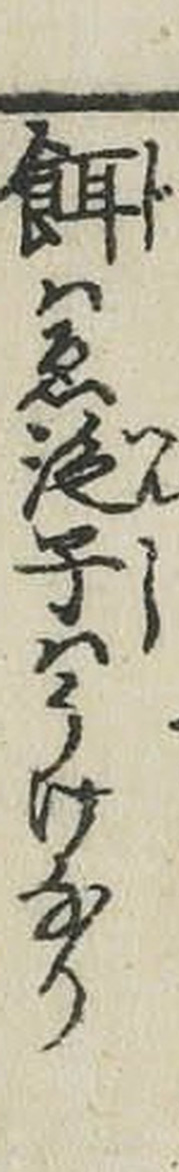餌はゑ泛子はうけなり

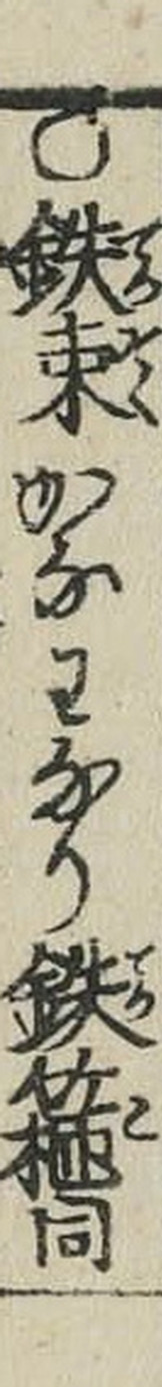○鉄束かなわなり鉄篐同
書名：増補頭書訓蒙図彙大成 10巻 5:巻之9-11
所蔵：東京学芸大学教育コンテンツアーカイブ
